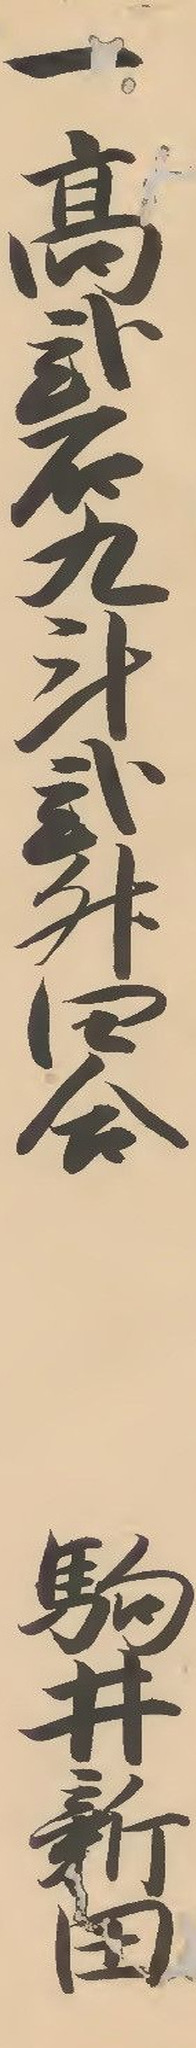一高弐石九斗弐升四合駒井新田
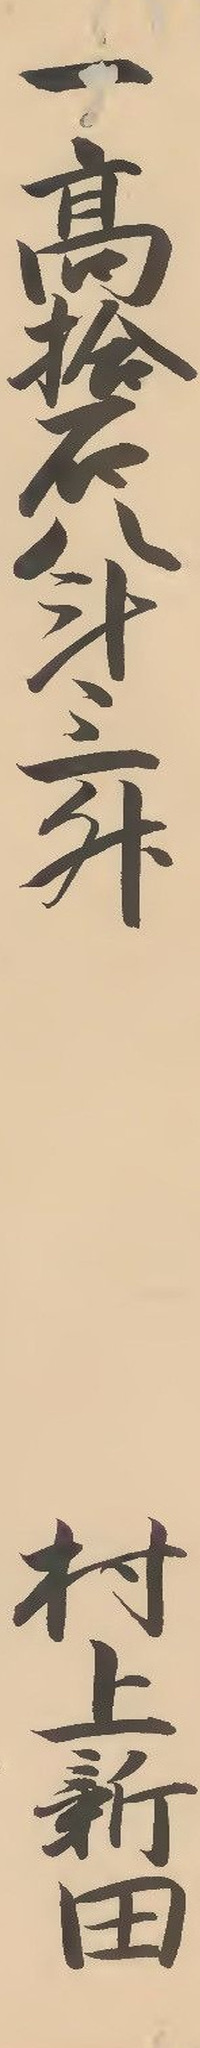一高拾石八斗三升村上新田
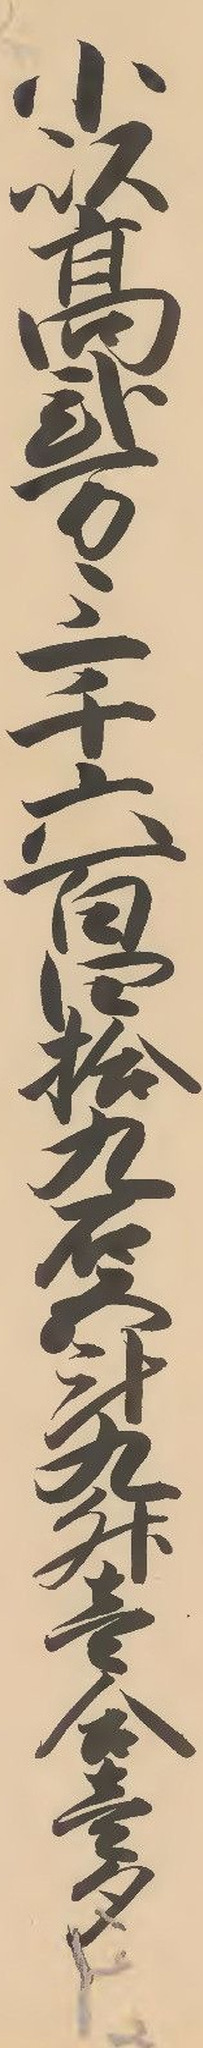小以高弐万三千六百四拾九石五斗九升壱合壱勺

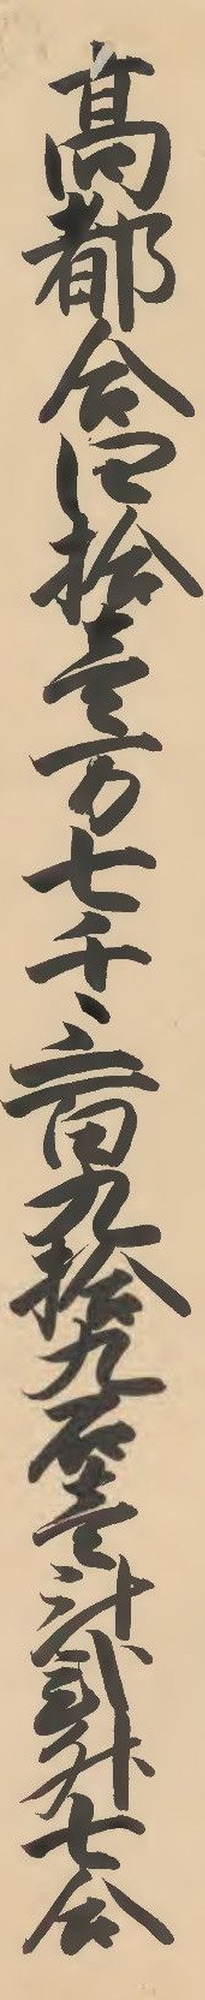高都合四拾壱万七千三百九拾九石弐斗弐升七合
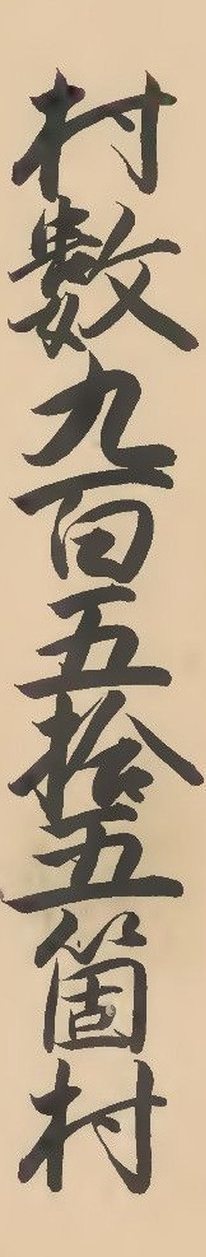村数九百五拾五箇村
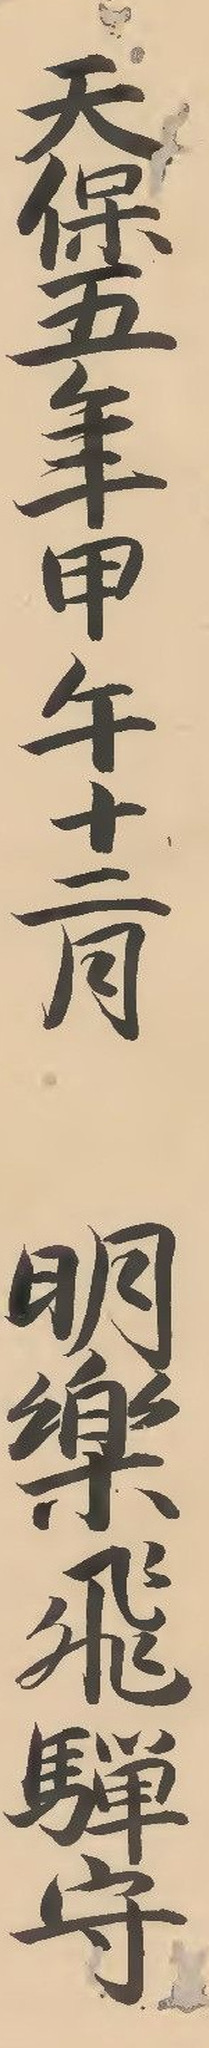天保五年甲午十二月明楽飛騨守
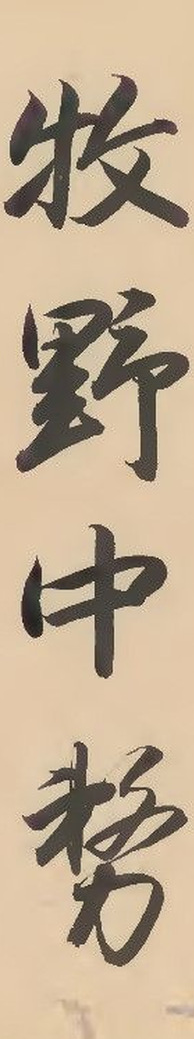牧野中務
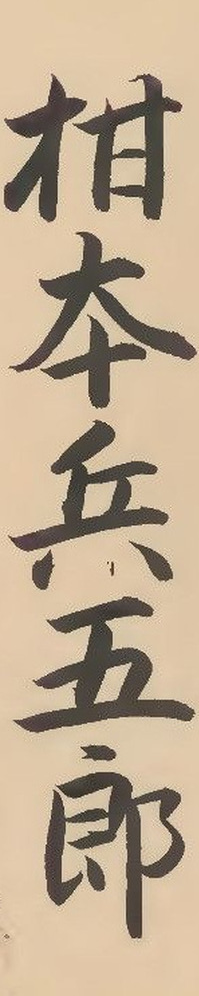柑本兵五郎
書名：摂津国郷帳
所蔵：国立公文書館 National Archives of Japan
